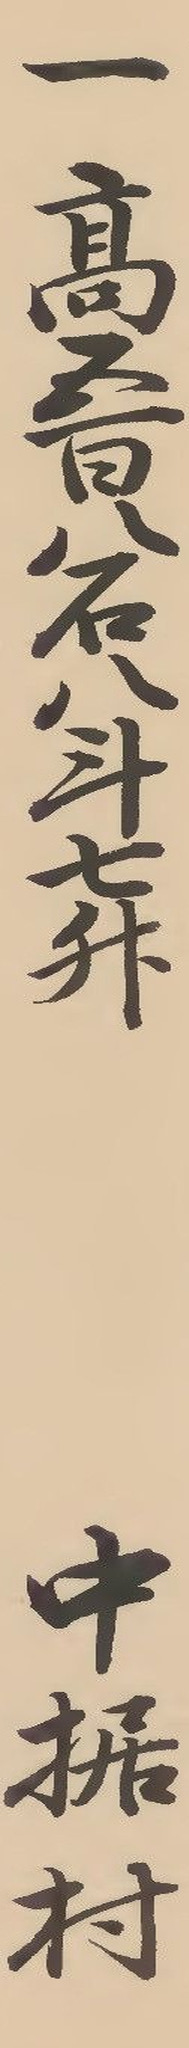一高五百八石八斗七升中据村
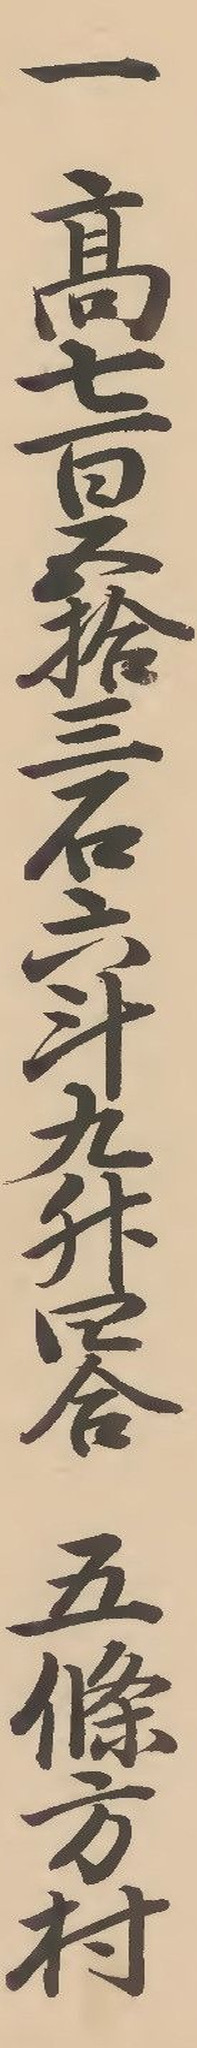一高七百五拾三石六斗九升四合五条方村

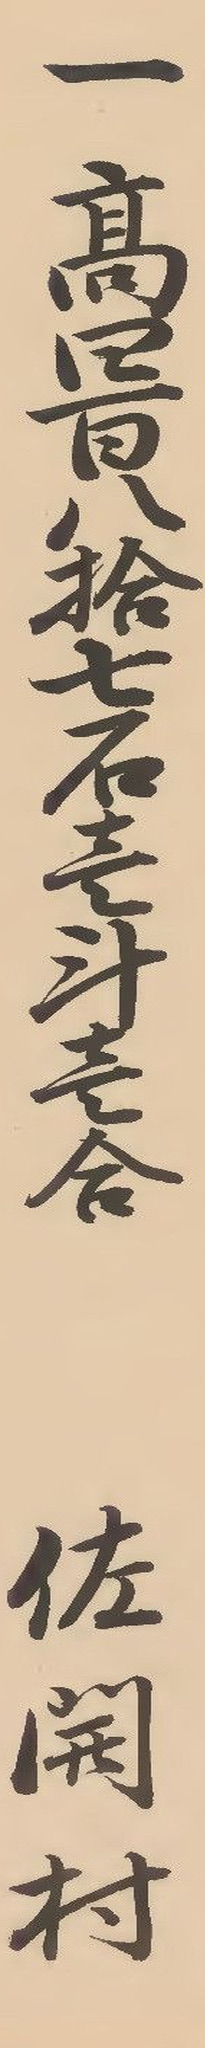一高四百八拾七石壱斗壱合佐開村
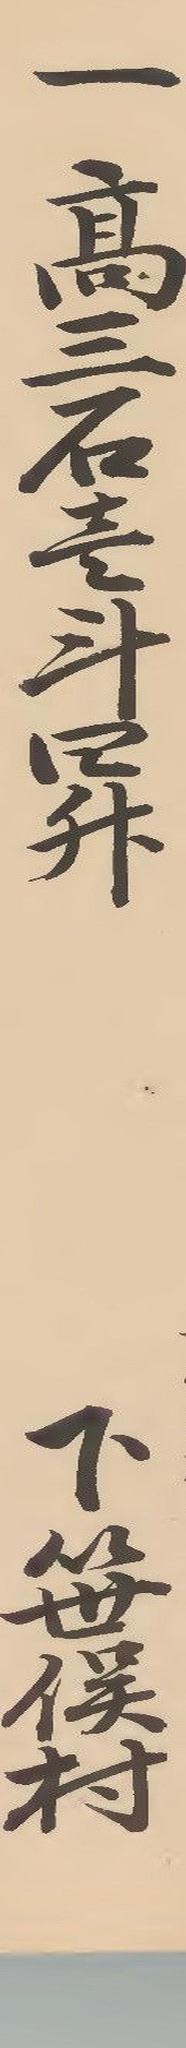一高八石八斗六升笹俣村

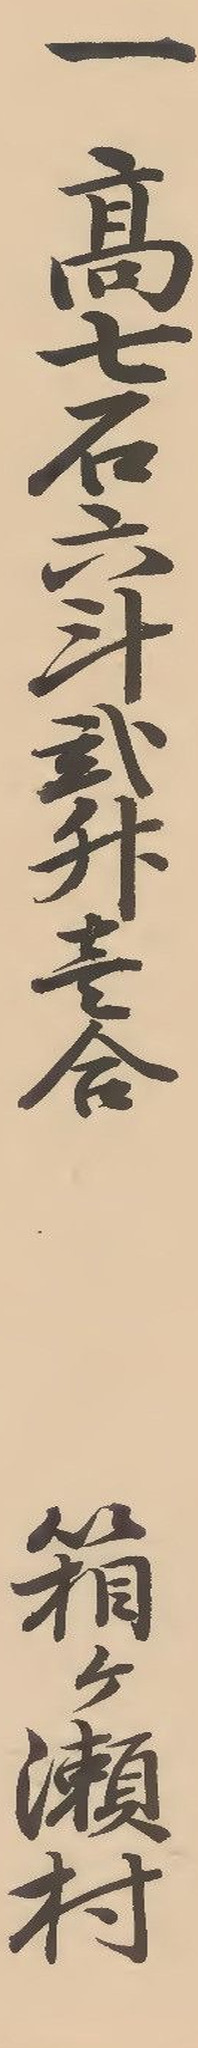一高七石六斗弐升壱合箱ヶ瀬村
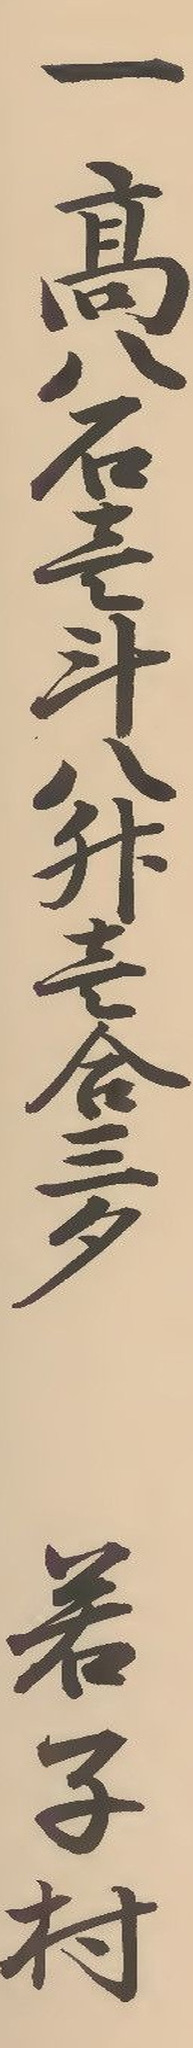一高八石壱斗八升壱合三勺若子村
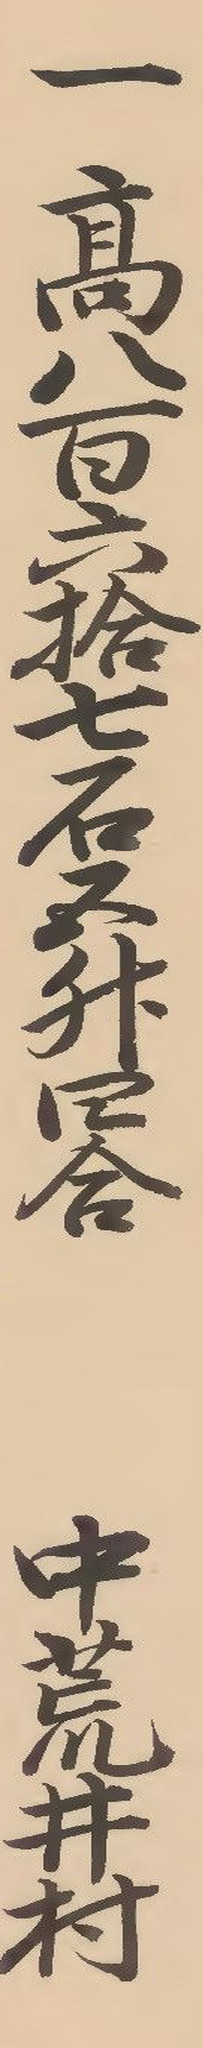一高八百六拾七石五升四合中荒井村
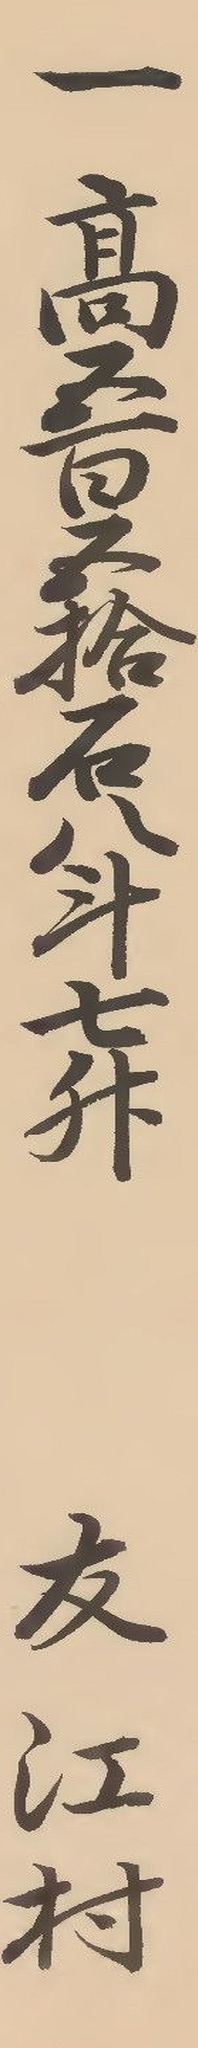一高五百五拾石八斗七升友江村
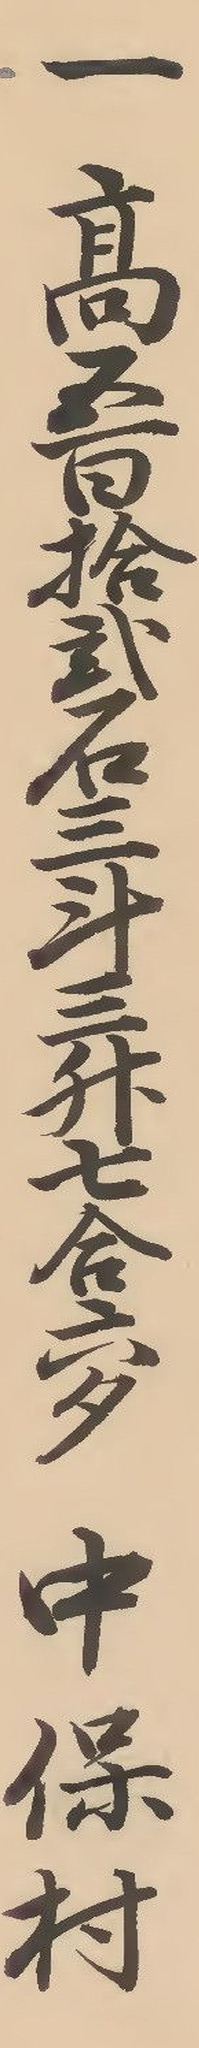一高五百拾弐石三斗三升七合六勺中保村

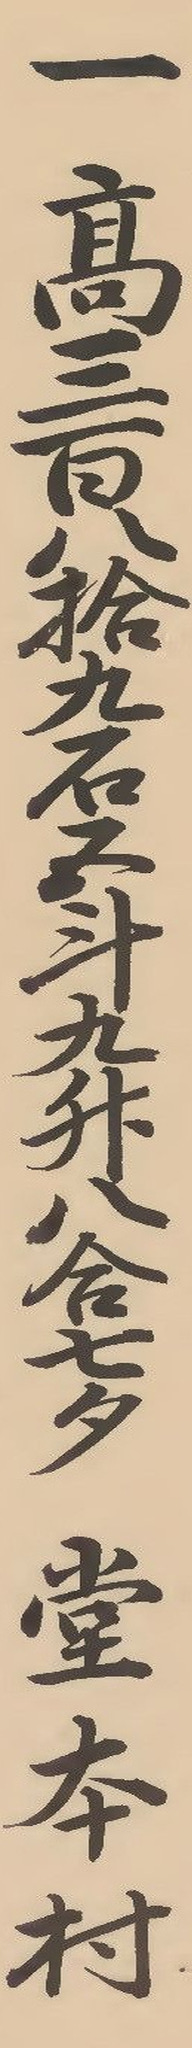一高三百八拾九石五斗九升八合七勺堂本村
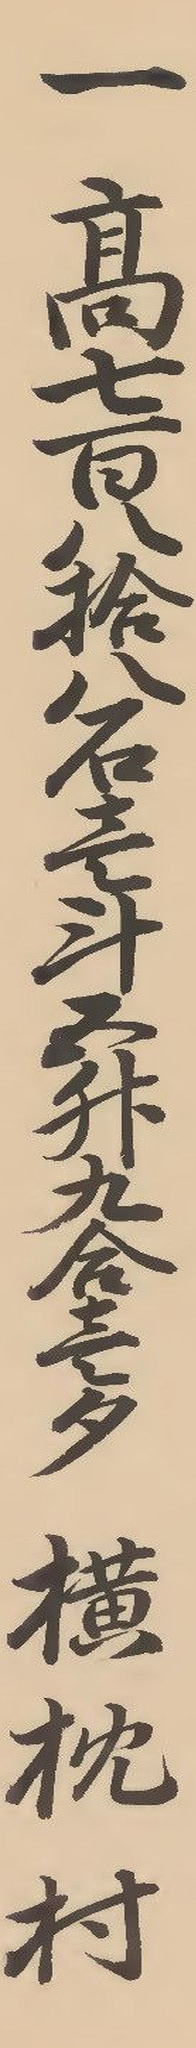一高七百八拾八石壱斗五升九合壱勺横枕村
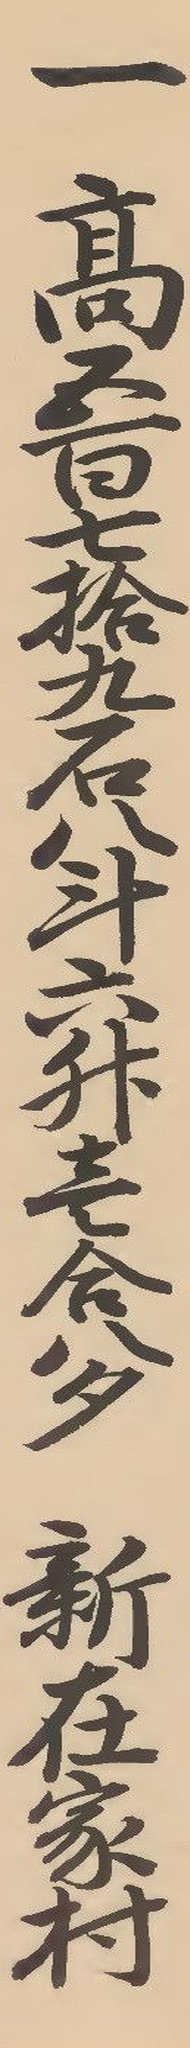一高五百七拾九石八斗六升壱合八勺新在家村
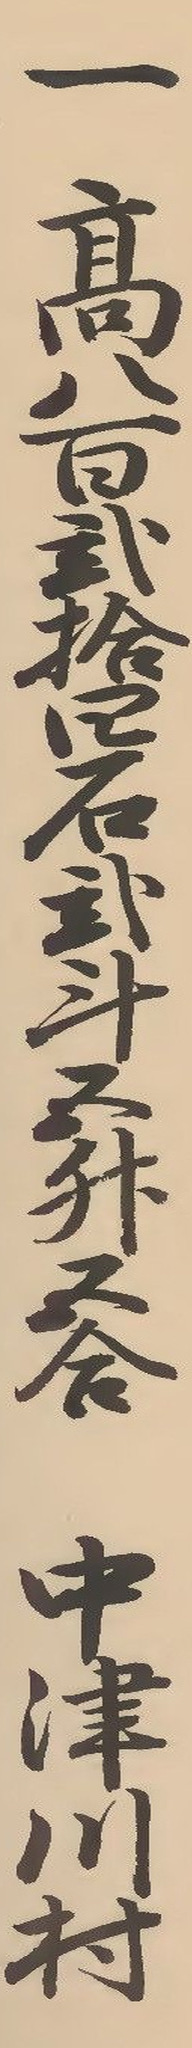一高八百弐拾四石弐斗五升五合中津川村
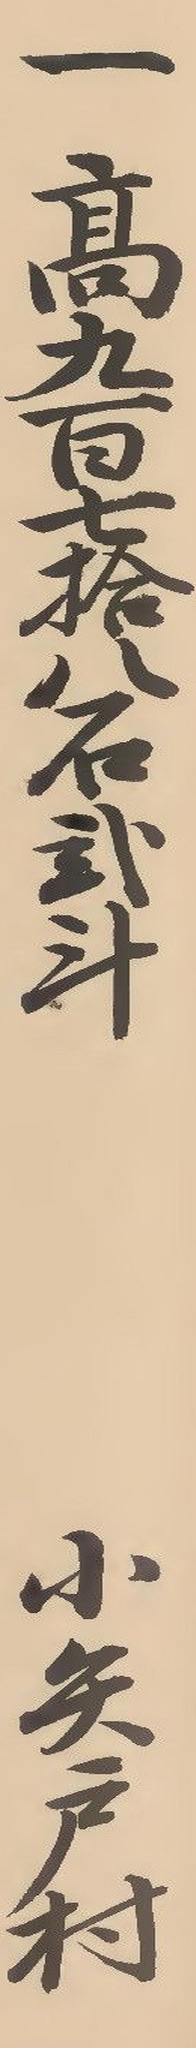一高九百七拾八石弐斗小矢戸村
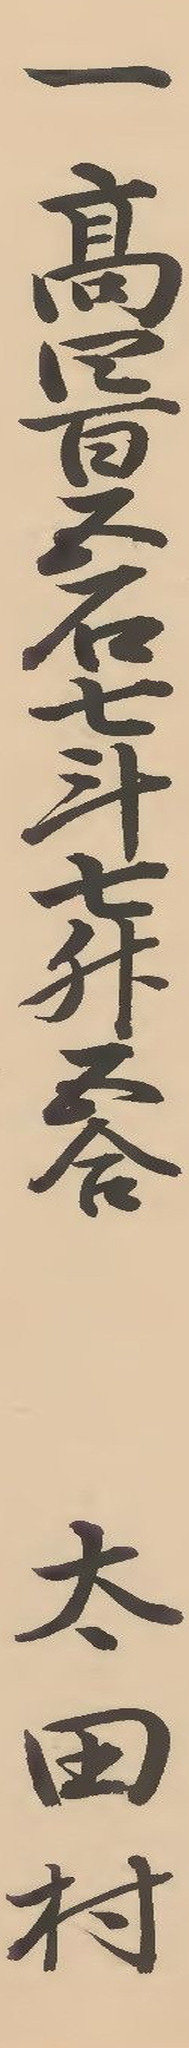一高四百五石七斗七升五合太田村
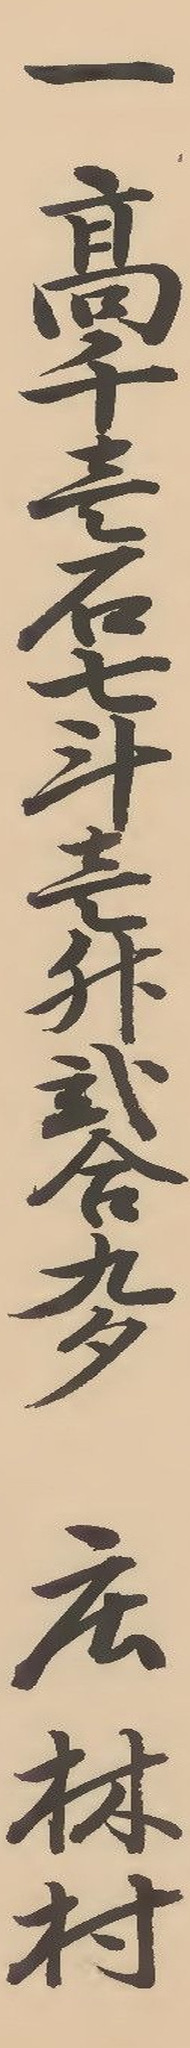一高千壱石七斗壱升弐合九勺庄林村
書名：越前国郷帳
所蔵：国立公文書館 National Archives of Japan
